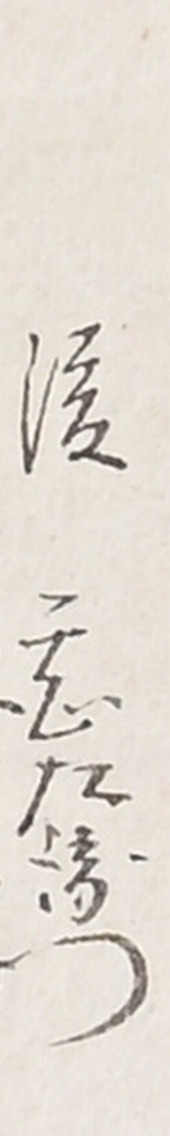後甚左衛門
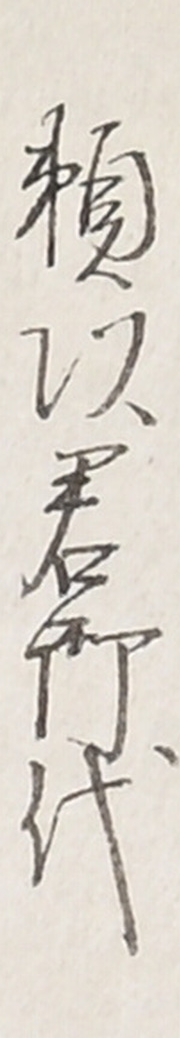頼以君御代
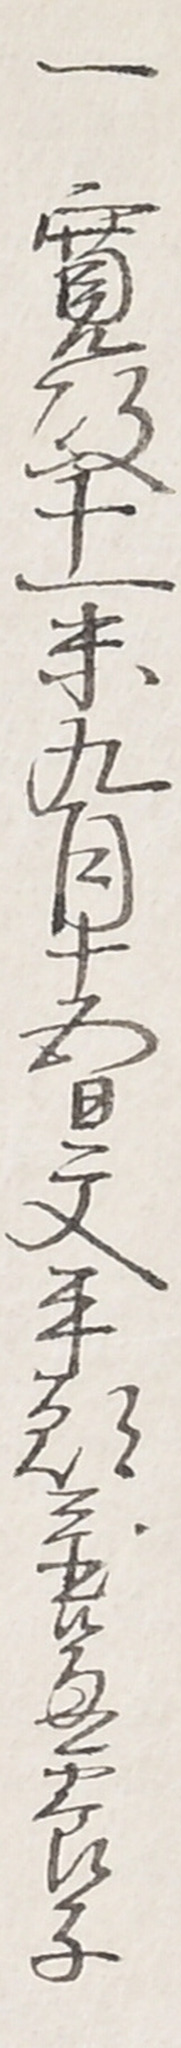一寛政十一未九月十五日文平願置候通養子
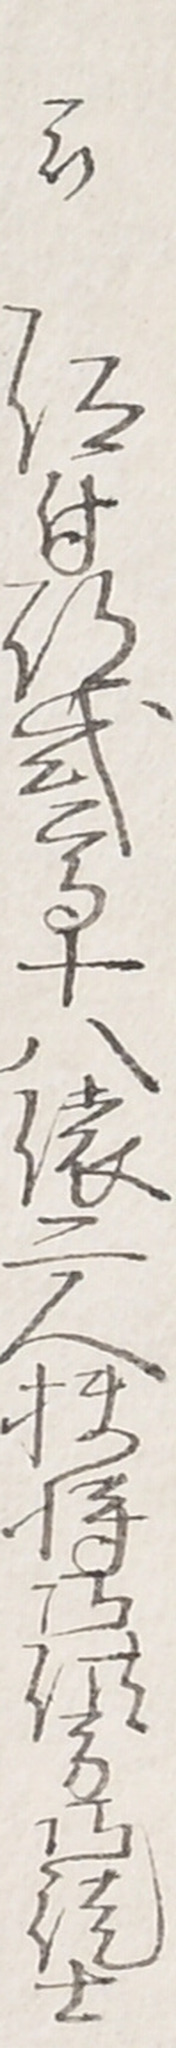被仰付跡式高十八俵二人扶持御供方御徒士
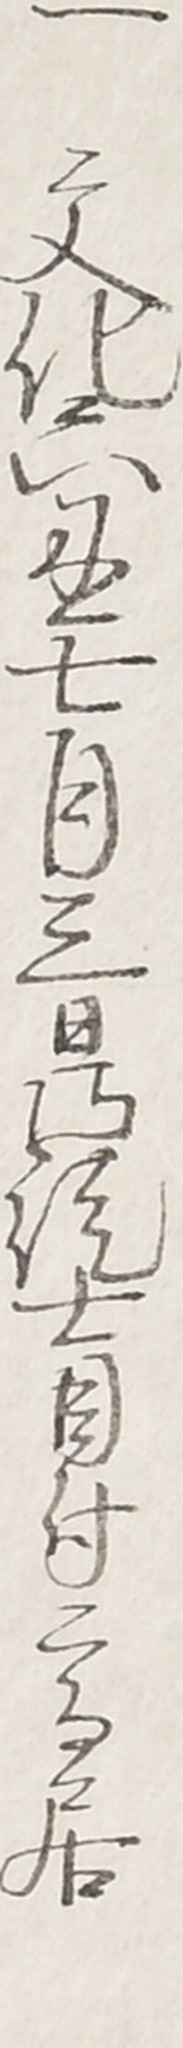一文化六丑七月三日御徒士目付高居
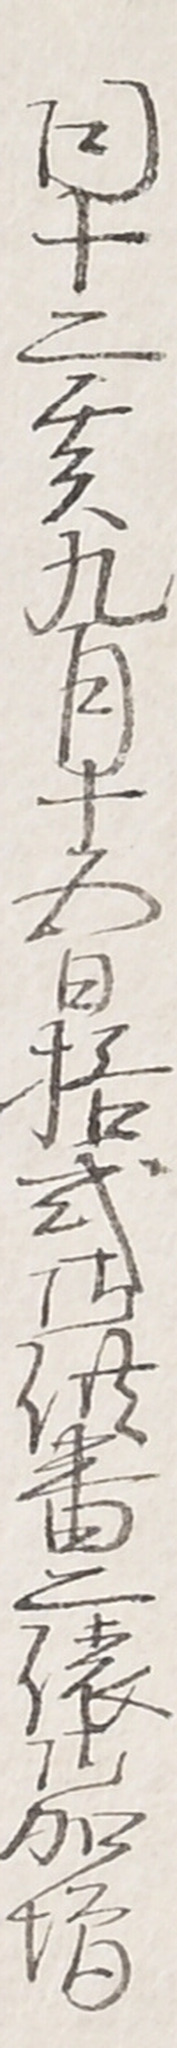一同十ニ亥九月十五日格式御供番二俵御加増
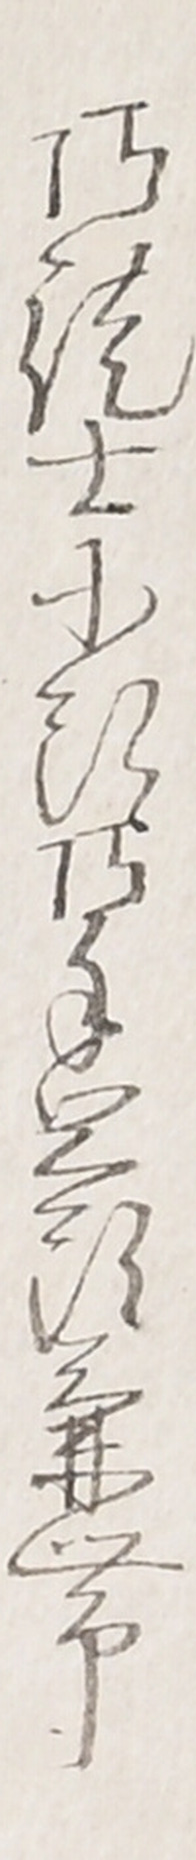御徒士小頭御手廻頭兼帯
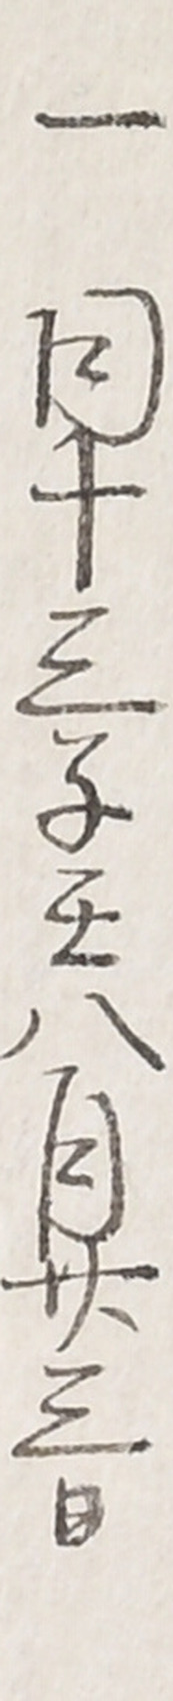一同十三子閏八月廿三日
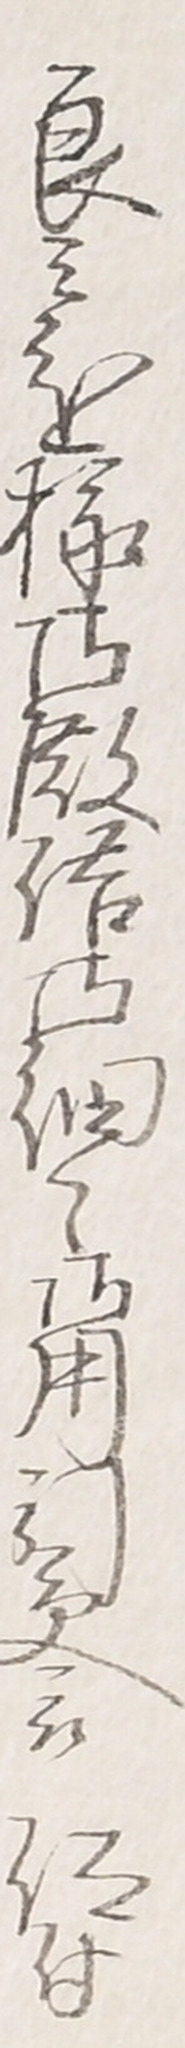良之進様御殿詰御細々御用引受被仰付
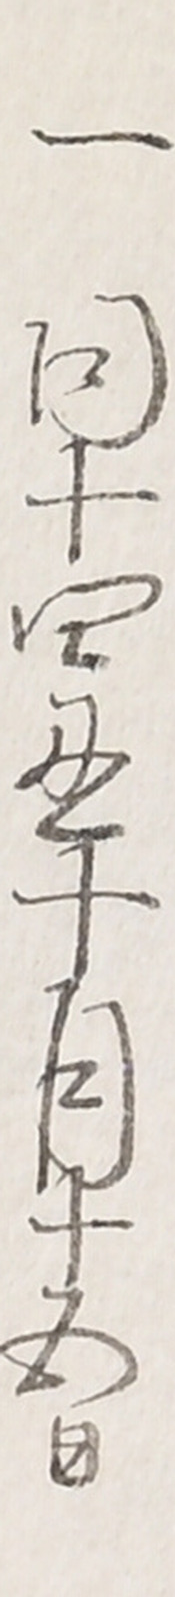一同十四丑十月十五日
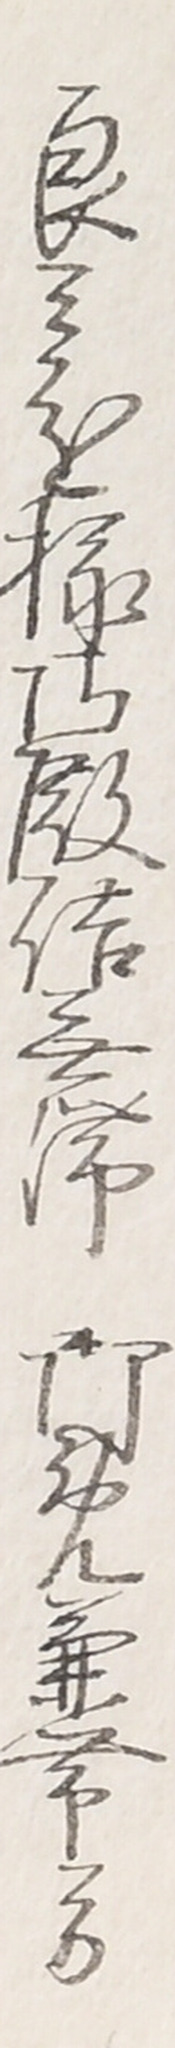良之進様御殿詰無滞御免兼帯方
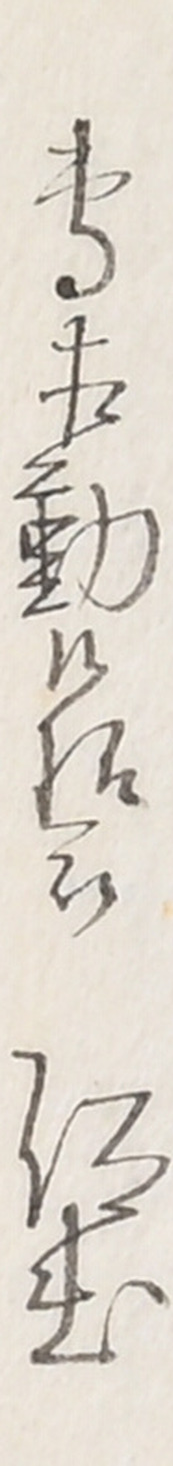専相勤候様被仰出
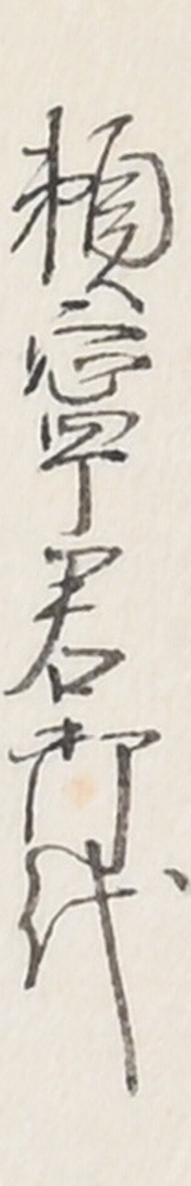頼寧君御代
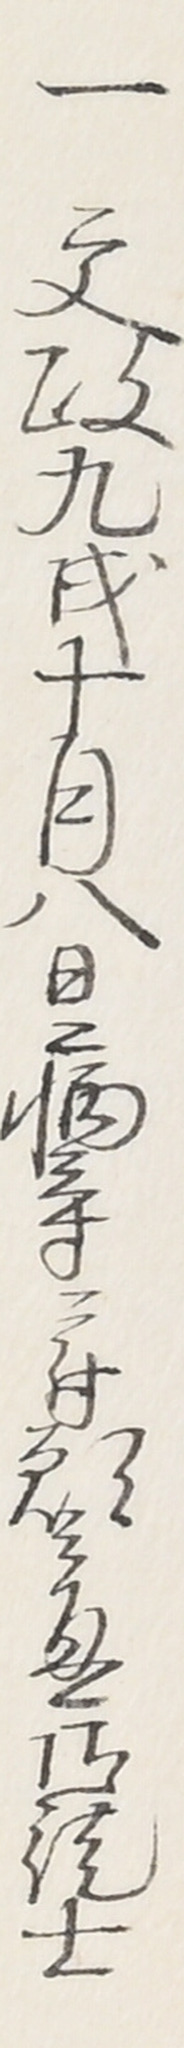一文政九戌十月八日病気ニ付願之通御徒士
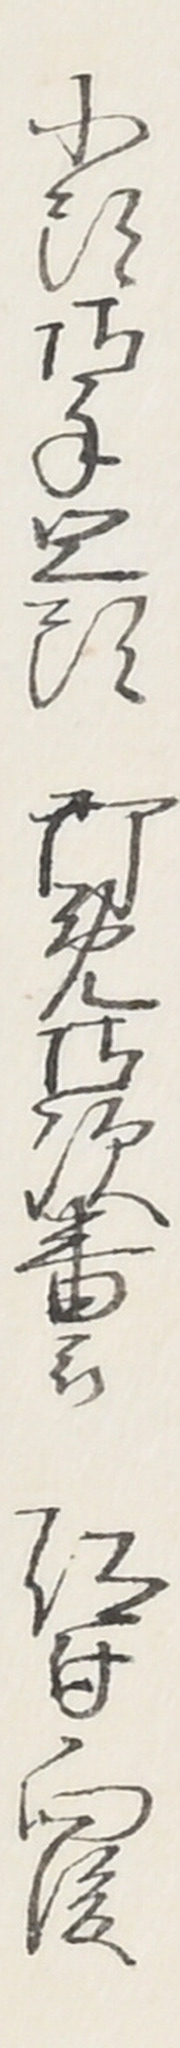小頭御手廻頭御免御次番被仰付向後
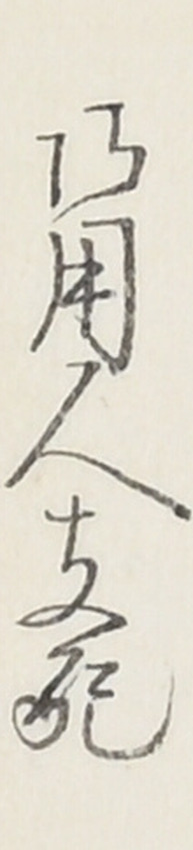御用人支配
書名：無足諸士勤仕録（四）
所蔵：伊那市立高遠町図書館・合同会社AMANE
